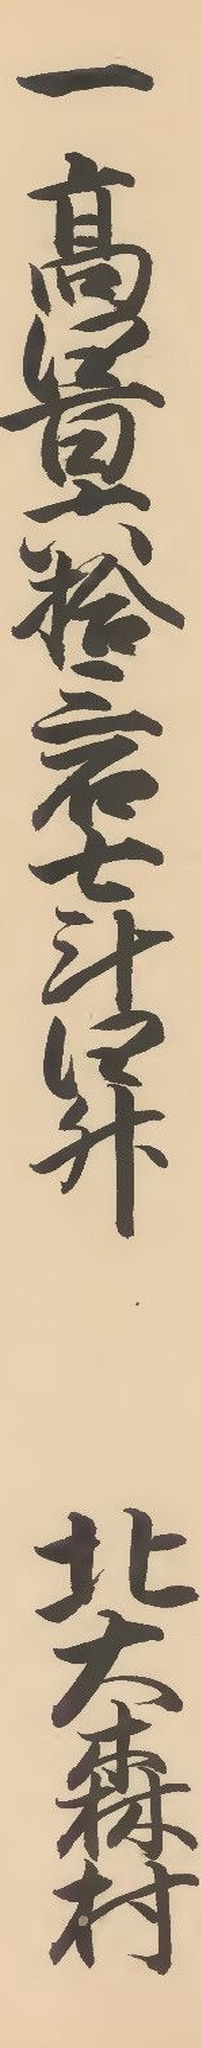一高四百六拾三石七斗四升北大森村
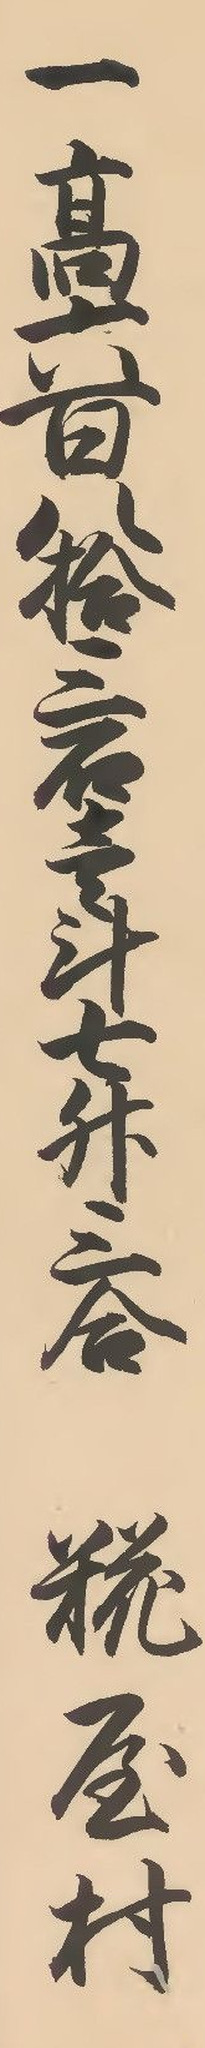一高六百八拾三石壱斗七升三合糀屋村
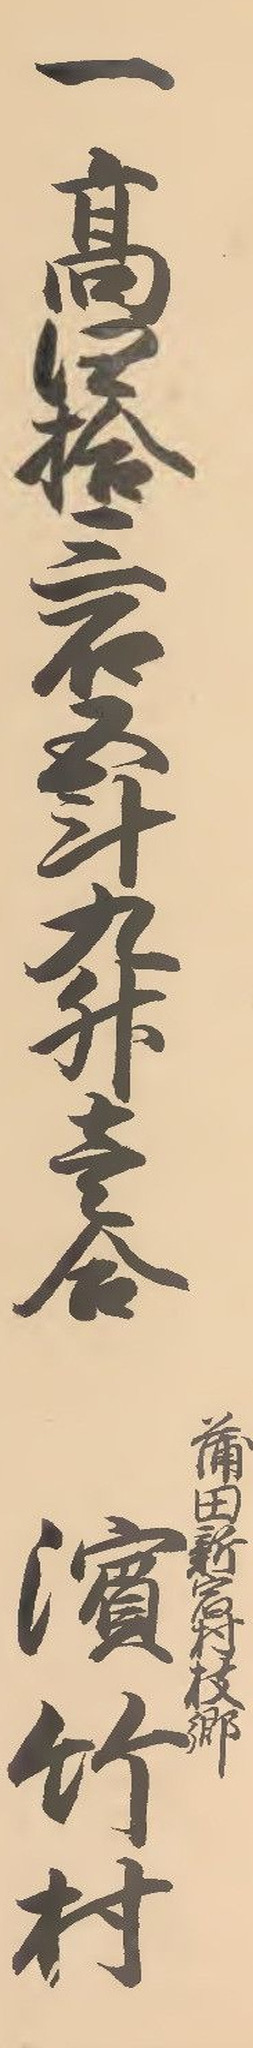一高四拾三石五斗九升壱合濱竹村
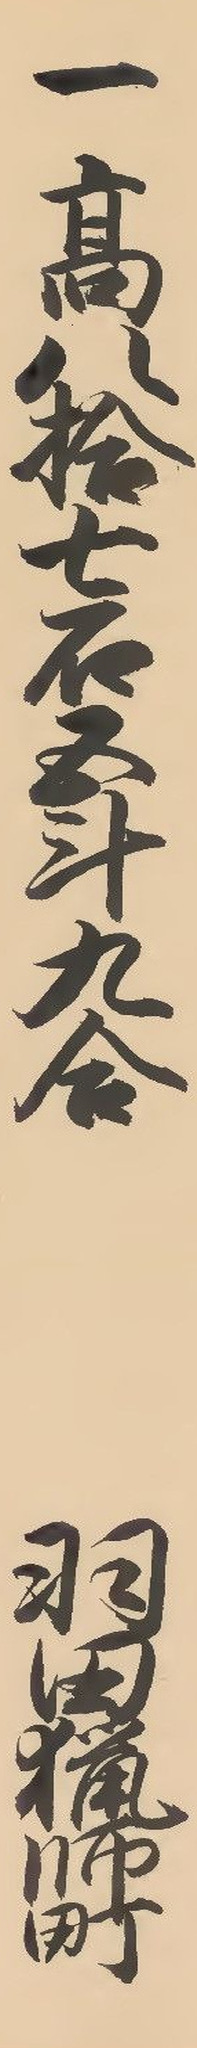一高八拾七石五斗九合羽田猟師村
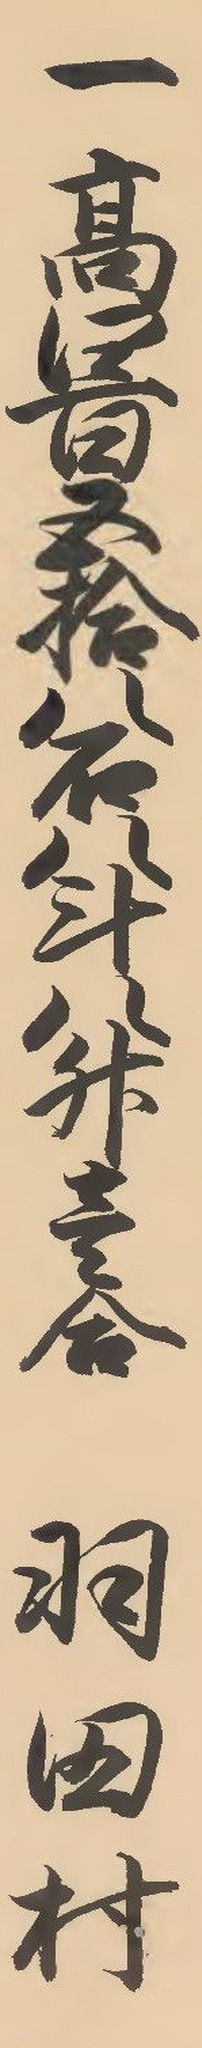一高四百五拾八石八斗八升壱合羽田村
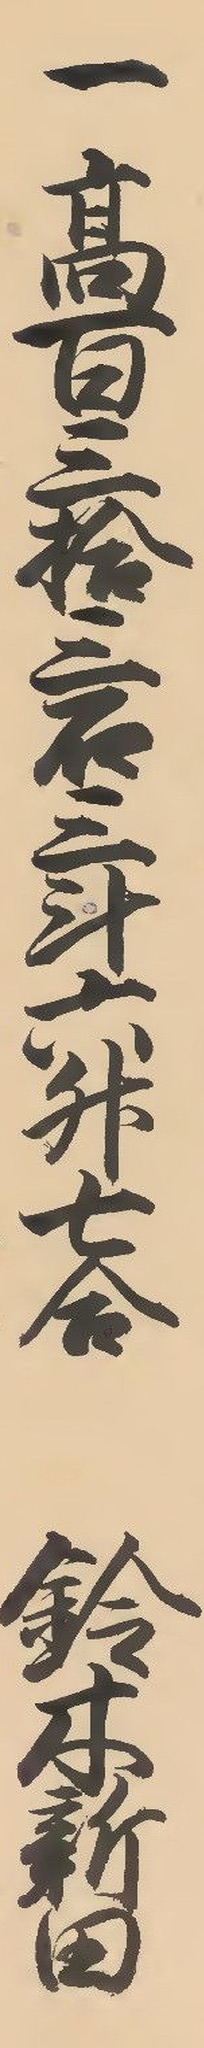一高百三拾三石三斗六升七合鈴木新田

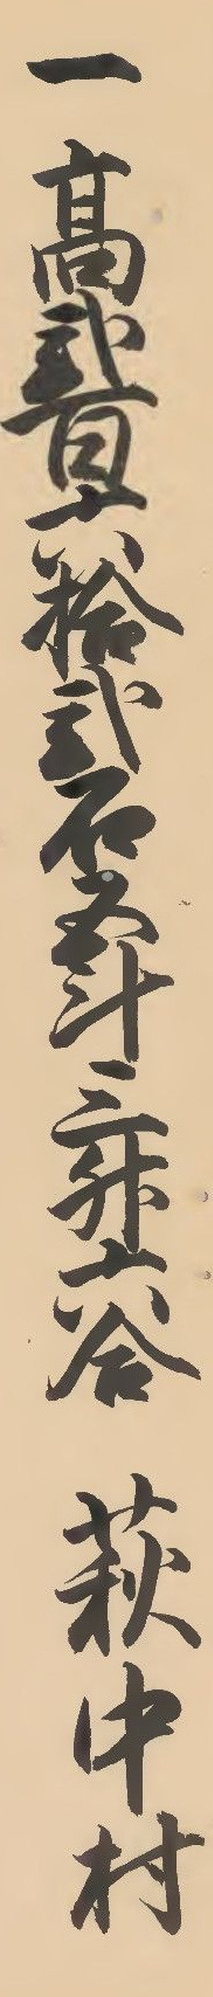一高弐百六拾弐石五斗三升六合萩中村
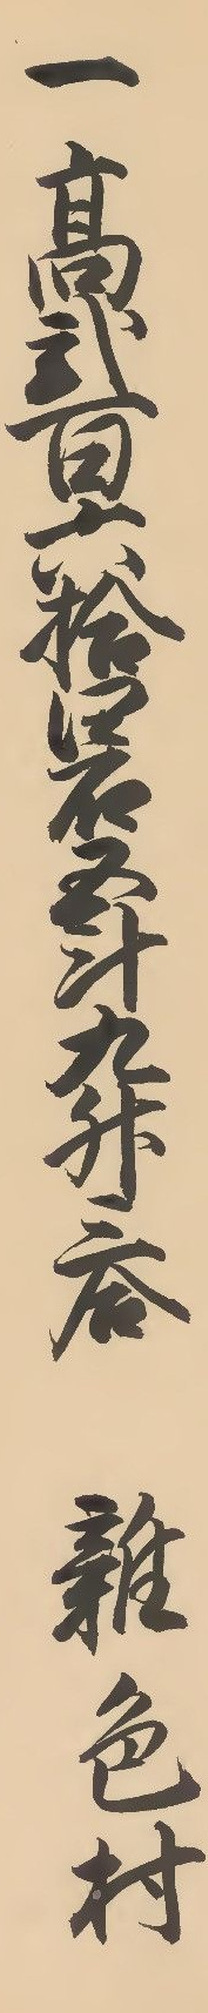一高弐百六拾四石五斗九升三合雑色村
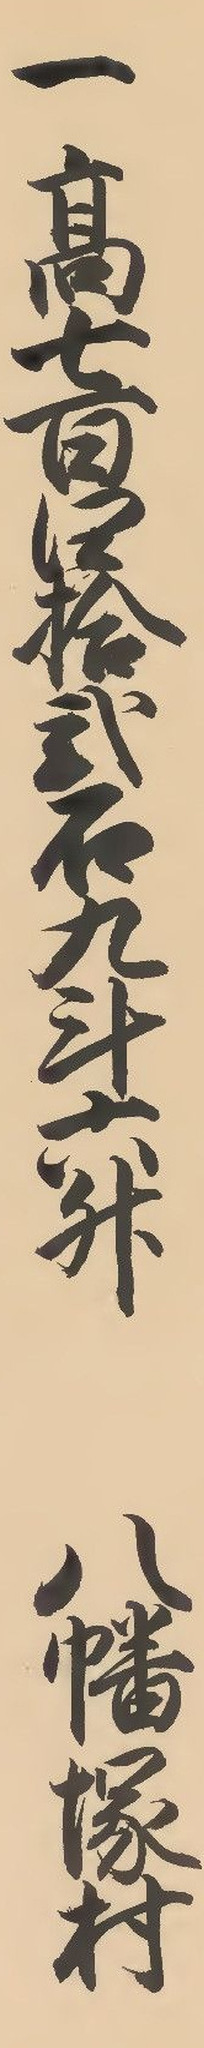一高七百四拾弐石九斗六升八幡塚村
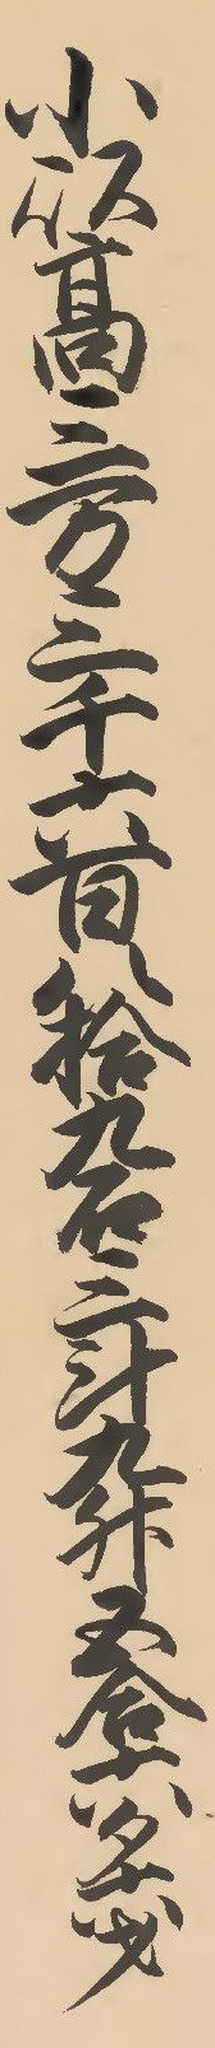小以高三万三千六百八拾九石三斗九升五合六勺六才

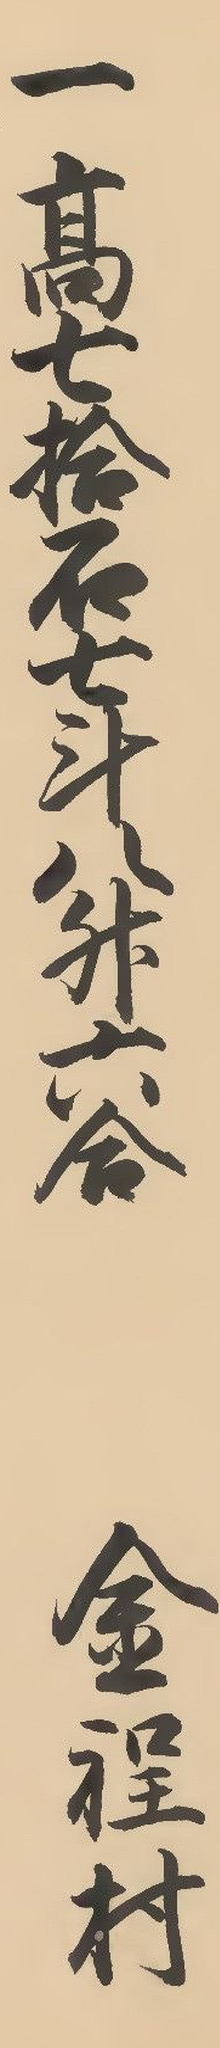一高七拾石七斗八升六合金程村
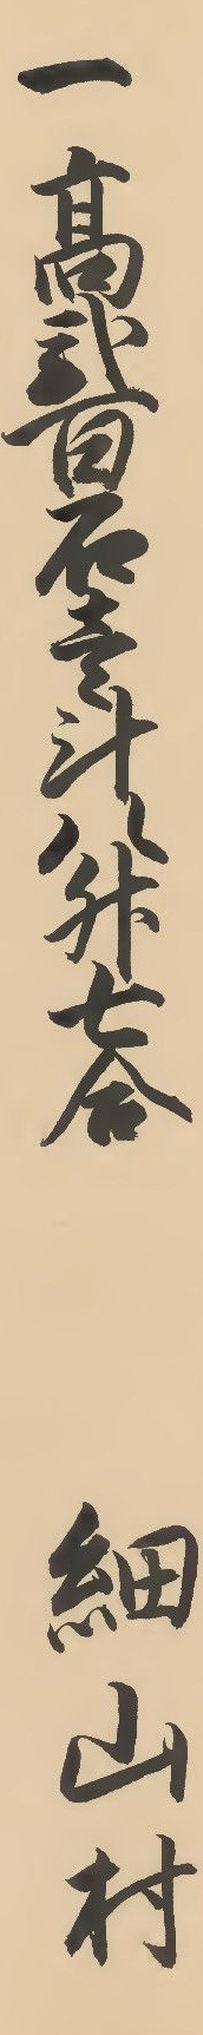一高弐百石壱斗八升七合細山村
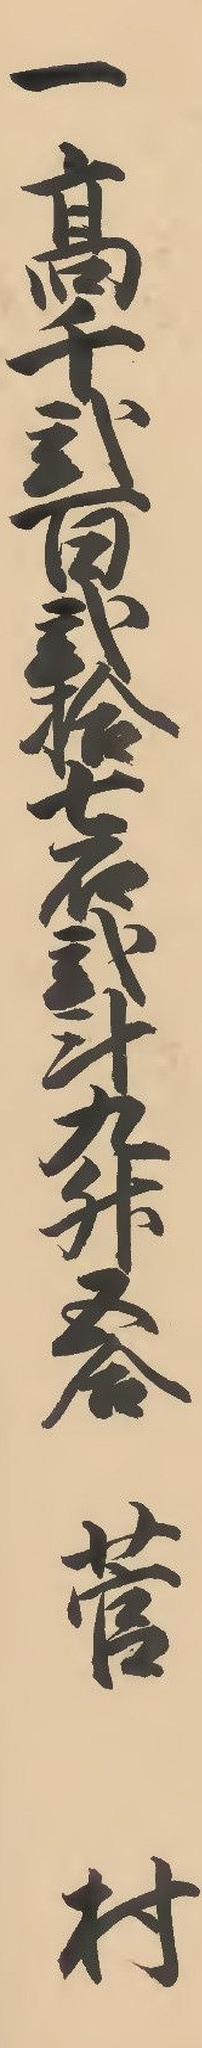一高千弐百弐拾七石弐斗九升五合菅村
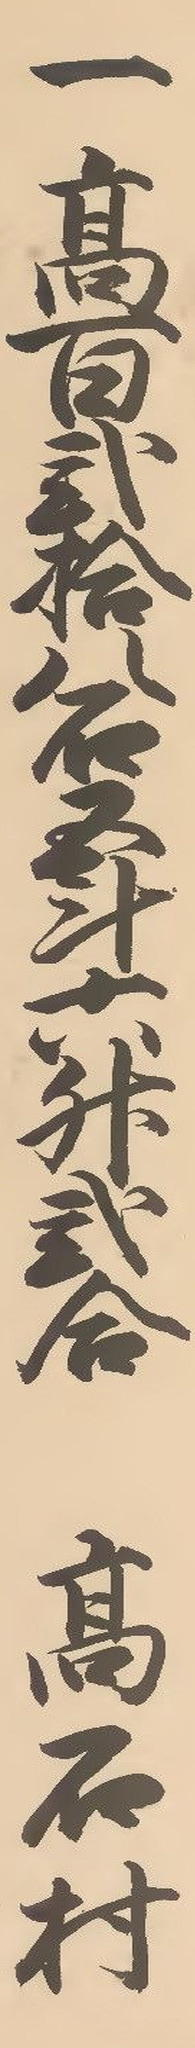一高百弐拾八石五斗六升弐合高石村
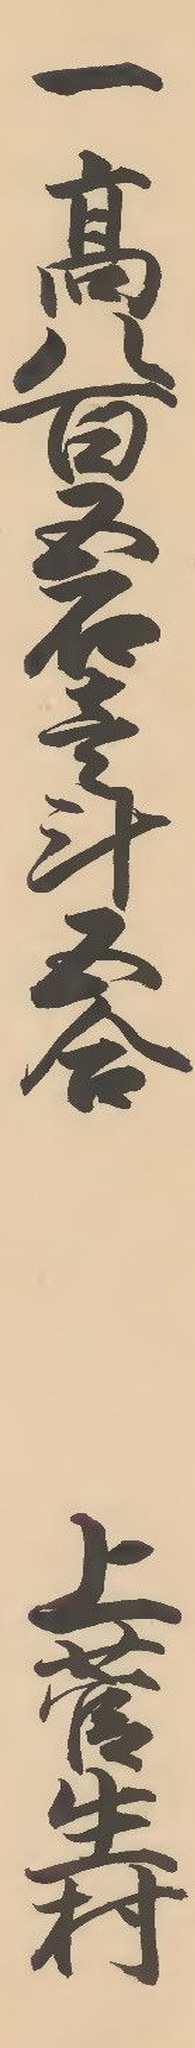一高八百五石壱斗五合上菅生村
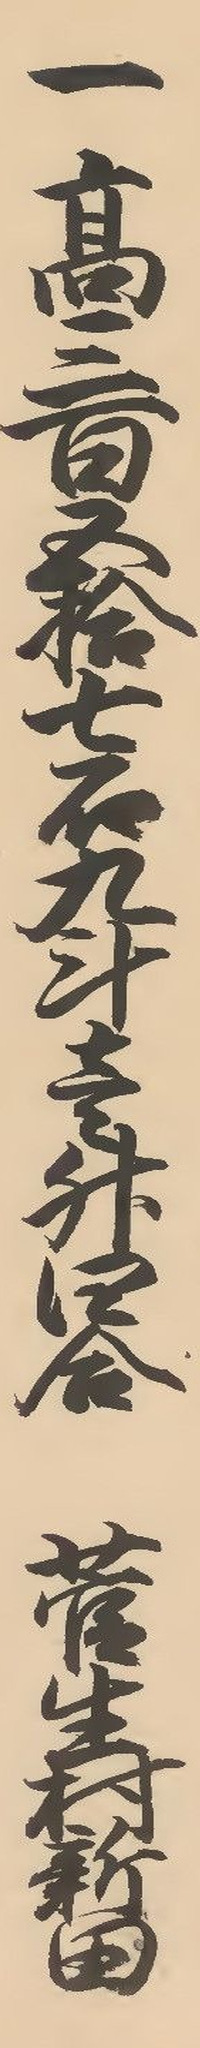一高三百五拾七石九斗壱升四合菅生村新田
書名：武蔵国郷帳　上
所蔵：国立公文書館 National Archives of Japan
